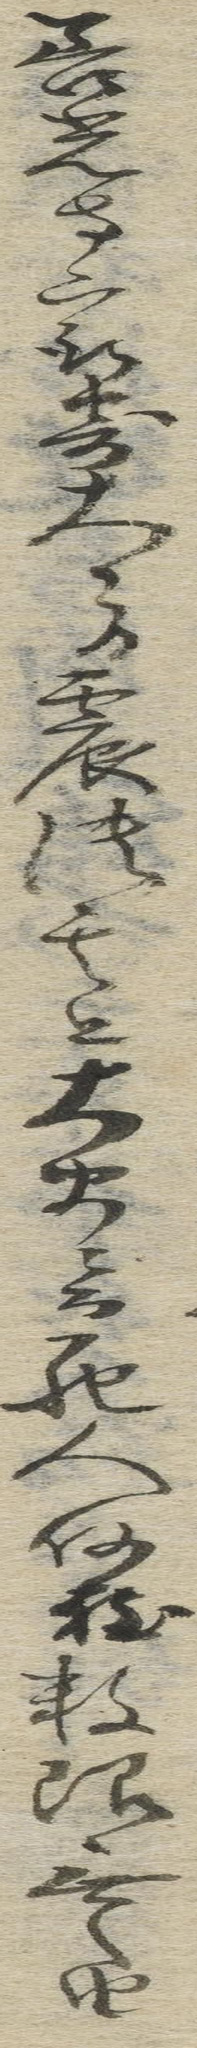善光寺最寄大方震潰其上大火二而死人何程数限無之由
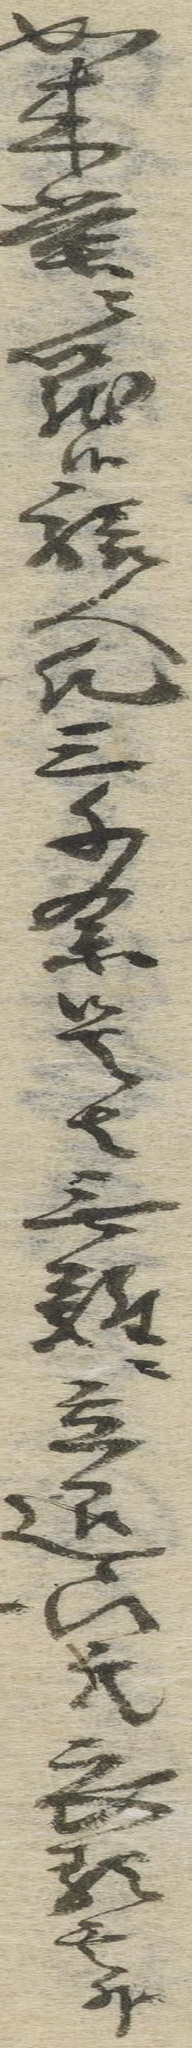如来堂二籠候旅人凡三千余是は無難二立退候得共衣類其外
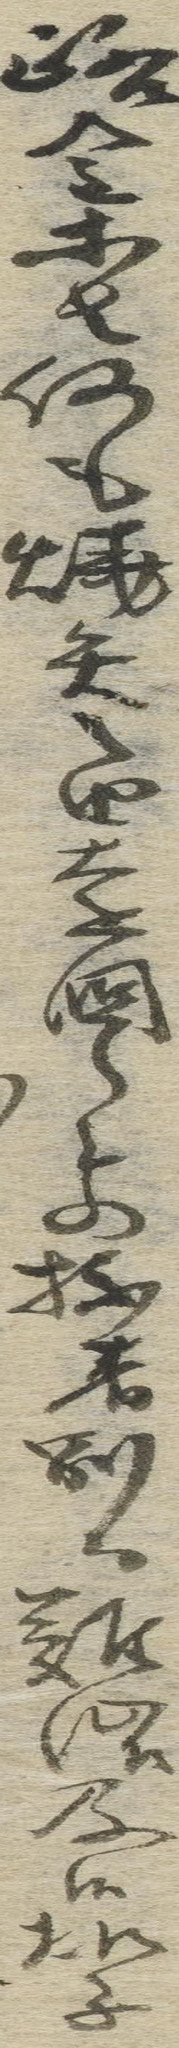路金等何も焼失之由遠国之もの別而及難渋及候様子
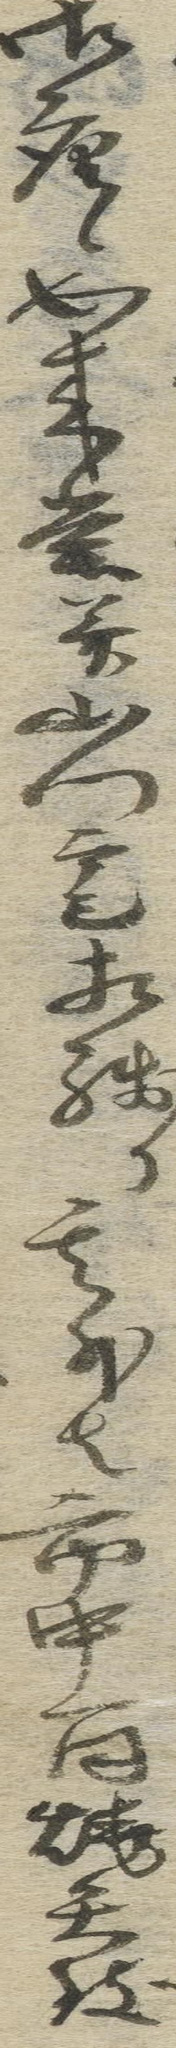御座候如来堂并山門而已相残り其外は市中一同焼失致
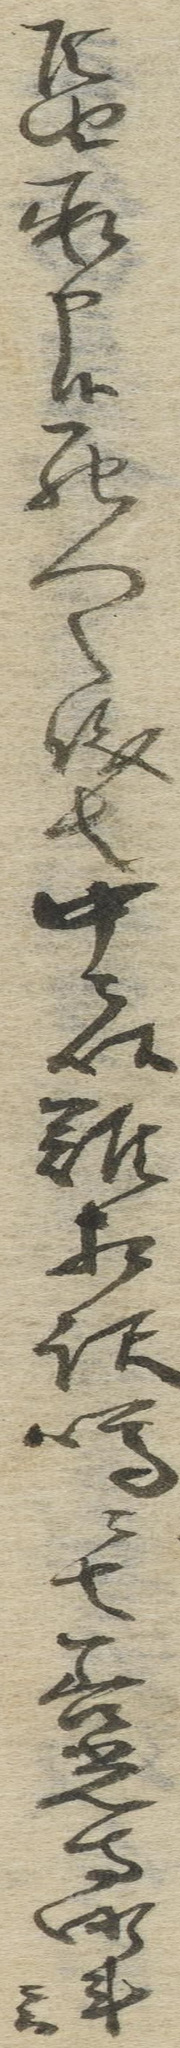候由承申候死人之儀は中々以難相訳噂候二は善光寺町計二而

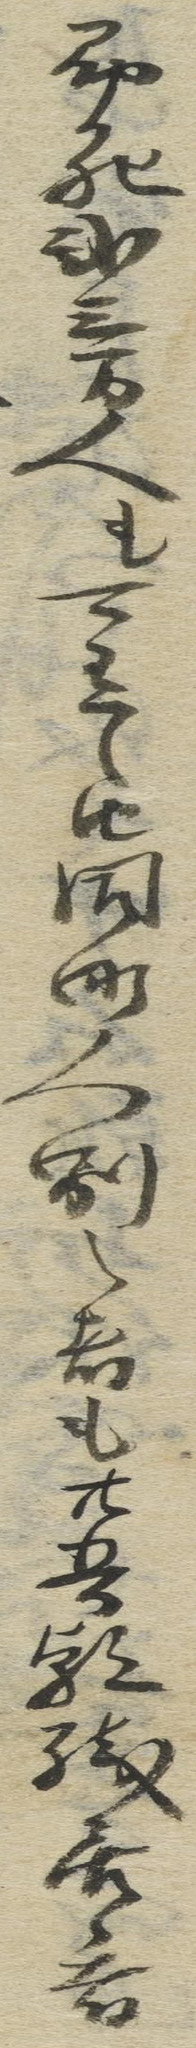即死人弐三万人も可有之候由同町人別之者も廿五日朝残居候者
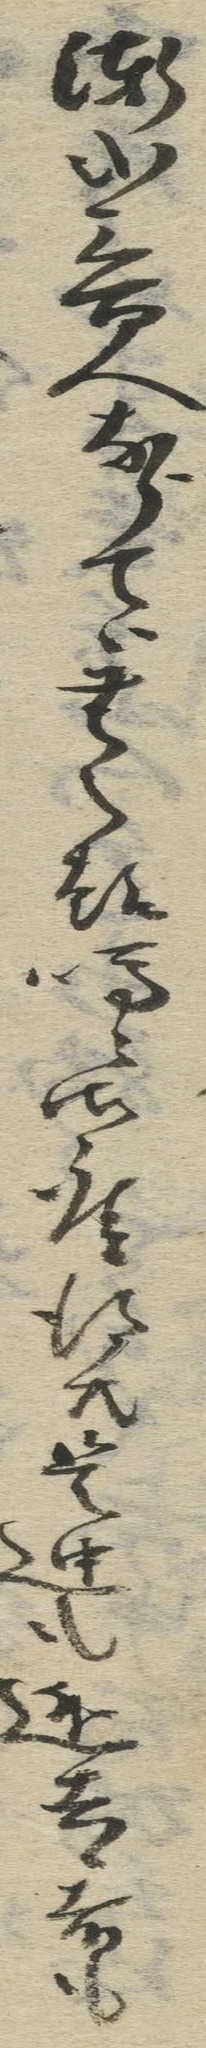漸弐三百人ならでハ無之趣噂二御座候得共是迚も逃去候者も
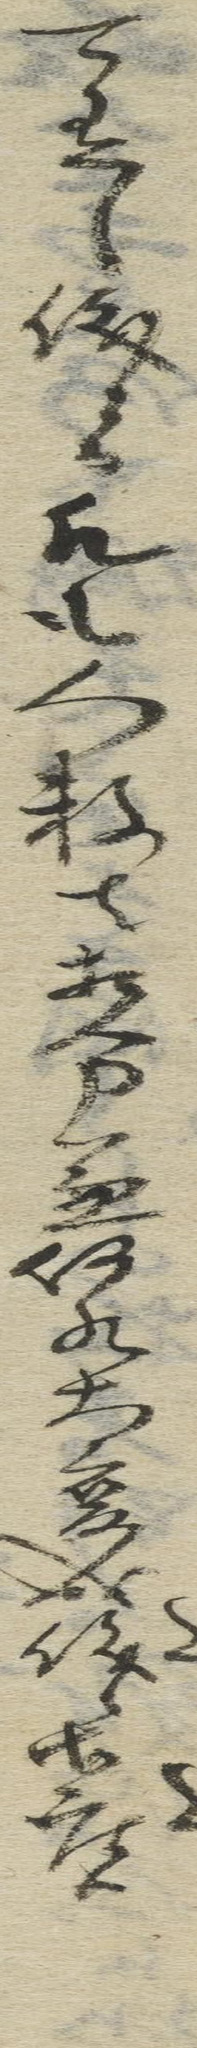可有之儀二而凡も人数は相分兼何れ大変成儀二御座候
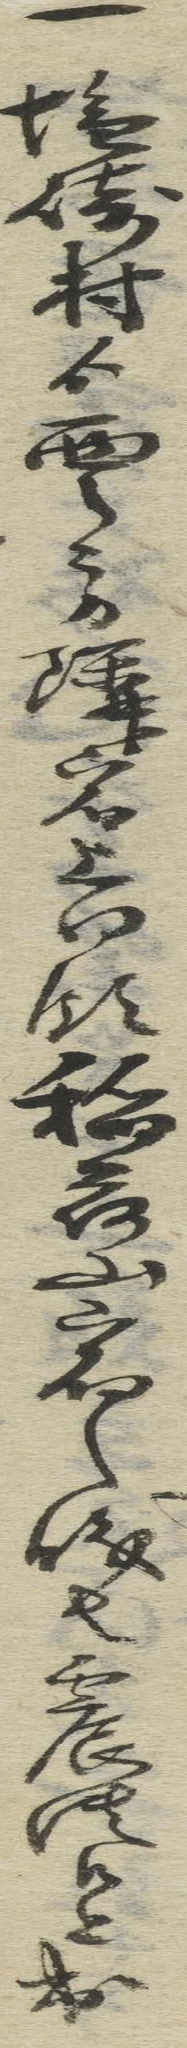一塩崎村ゟ西之方隣宿上田領稲荷山宿之儀ハ潰候上出
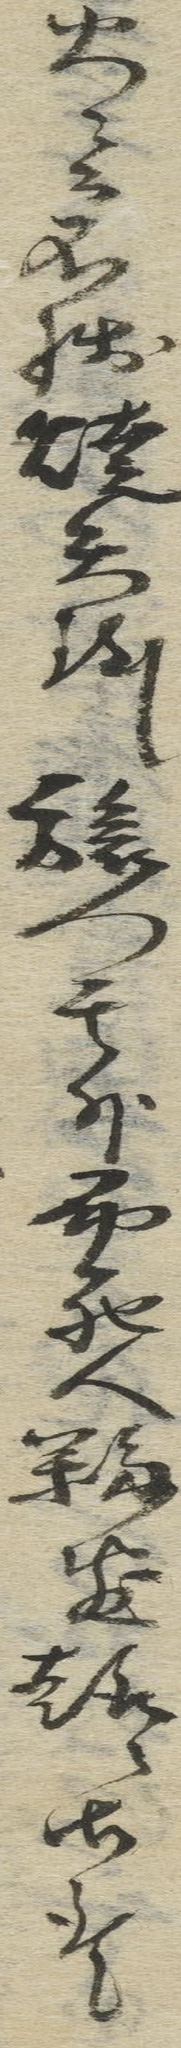火二而不残焼失致し旅人其外即死人夥敷趣二御座候
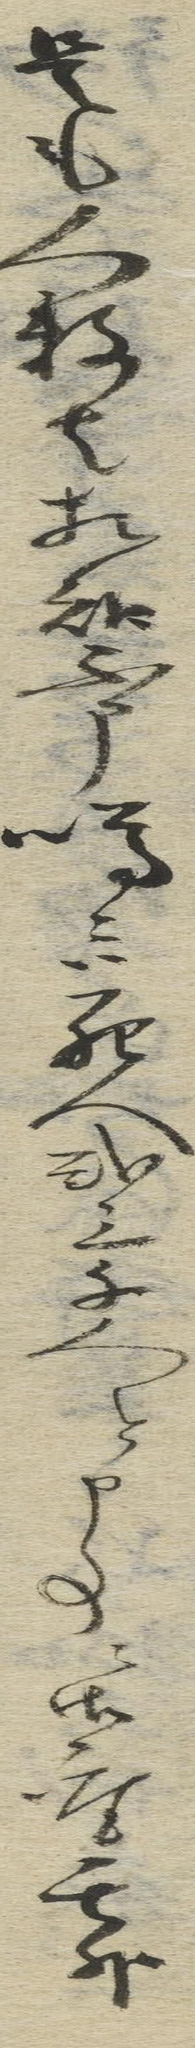是も人数は相知不申噂二は死人弐三千人と申事二御座候其外
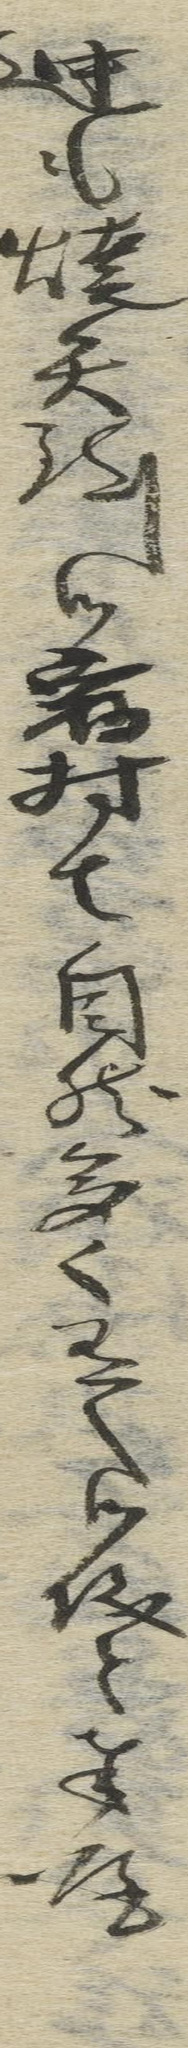迚も焼失居致し候宿村々ハ自然多く有之候儀と奉存候
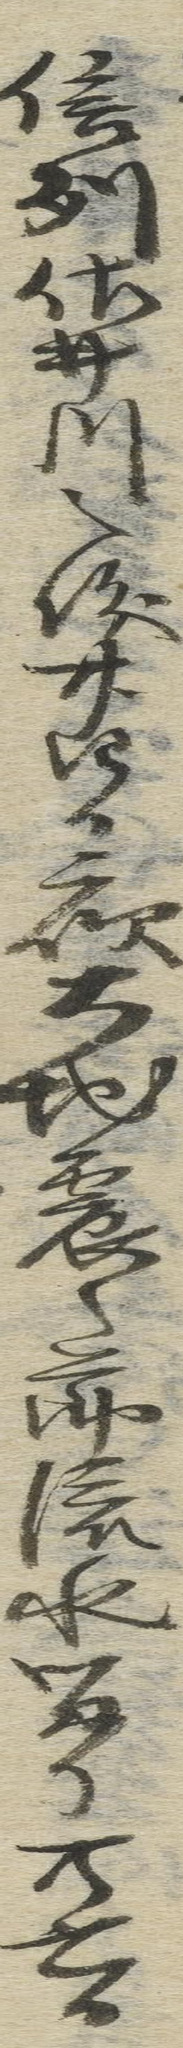一信州佐井川之儀廿四日夜大地震之節流水留り廿六日
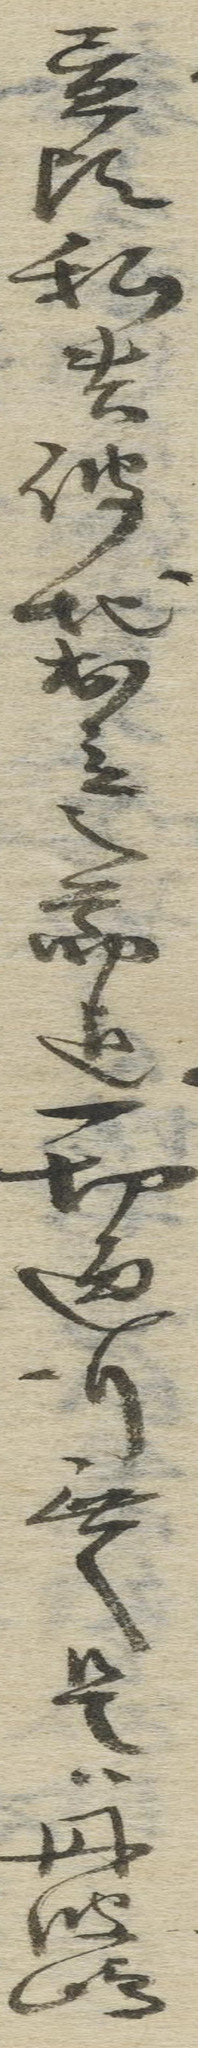昼頃私共彼之地出立之節迄一切通行無之是ハ丹波嶋
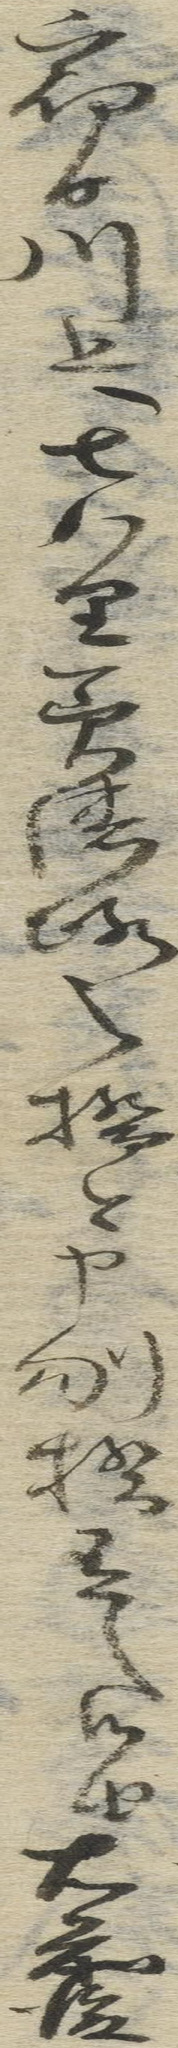宿ゟ川上へ七八里美濃路之橋と申刎橋有之候由右前後
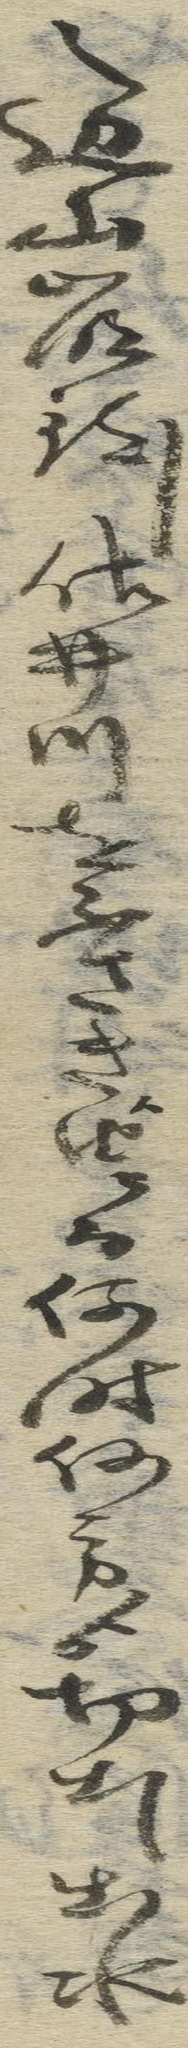之辺山崩致し佐井川をふさき候由二而何時何方ゟ切出し出水
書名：信濃越後　地震書留
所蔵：東京大学地震研究所図書室 Earthquake Research Institute Library, The University of Tokyo, JAPAN
